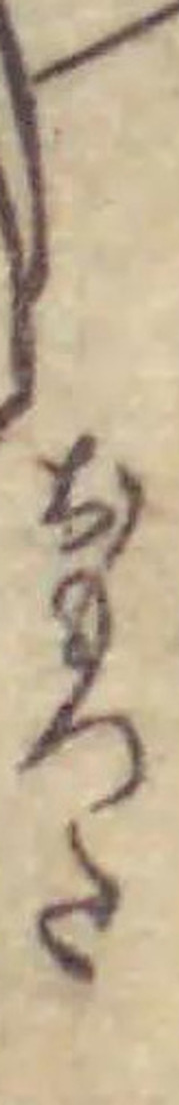おもつた
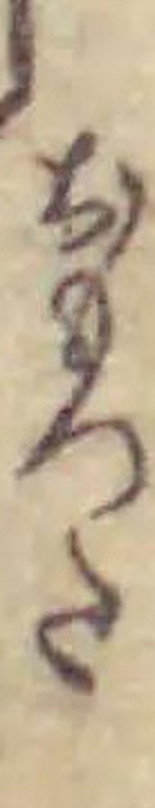おもつた
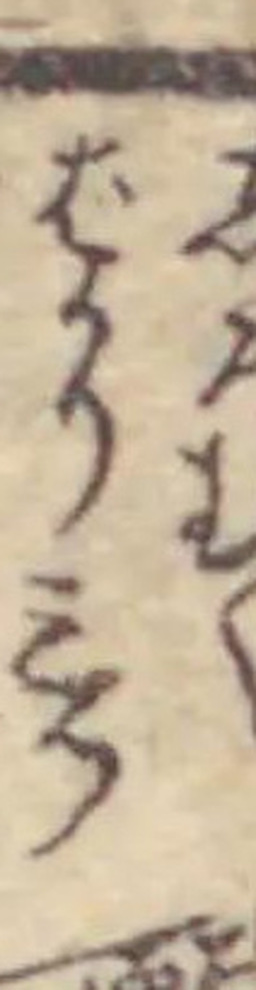ばかり三ツ
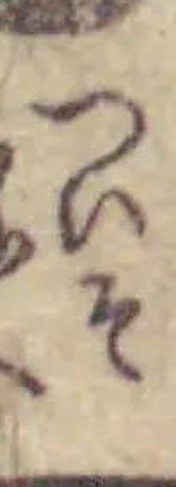ついそ
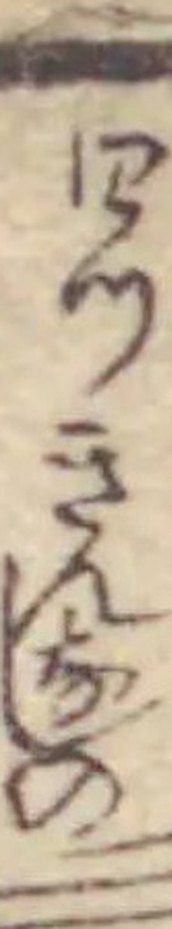四ツきんなしの
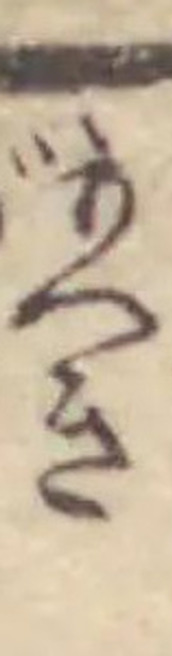もへき
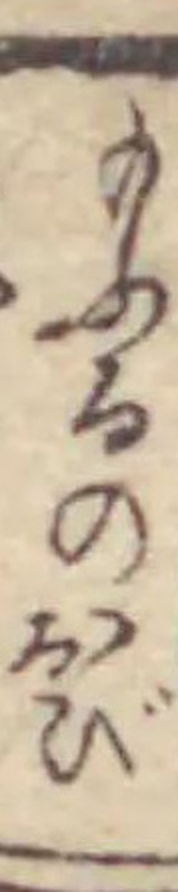もふるのおび
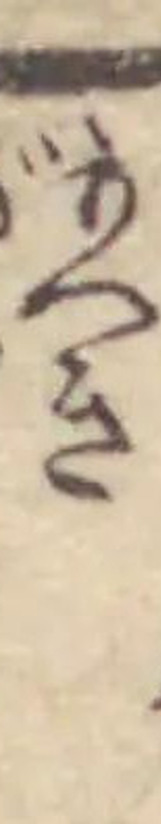もへき
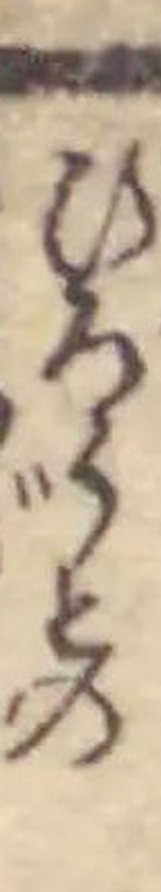びろうとの
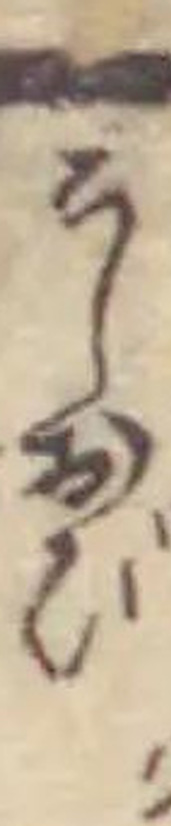こしおび
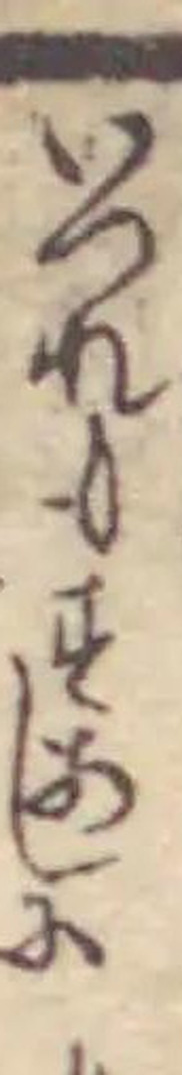いつれもすあしに
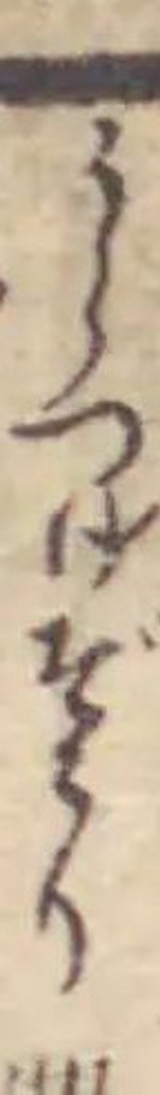うらつけぞうり
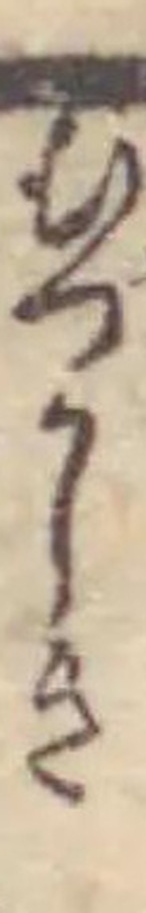むづかしき
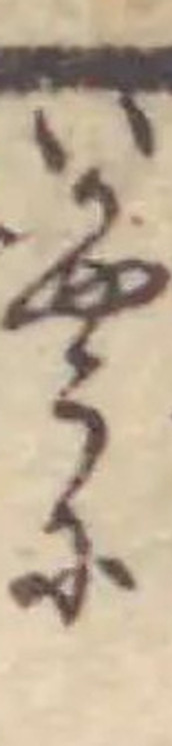いかやうに
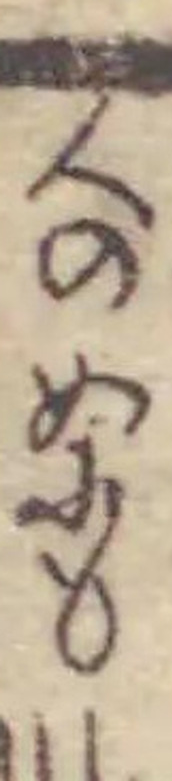人のめにも
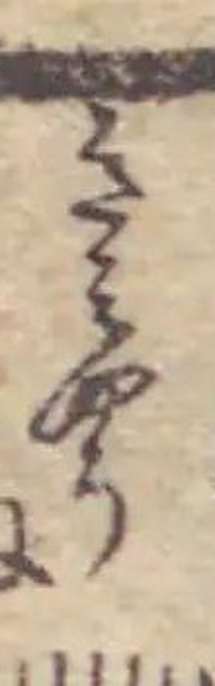きみやうに
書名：家伝寿命薬 2巻
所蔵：国立国会図書館 National Diet Library, JAPAN
